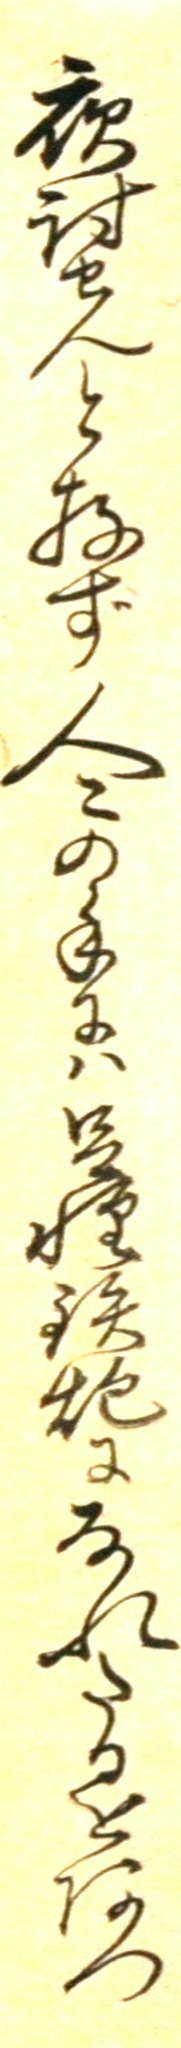夜討せんと存ず人々の手には足軽鉄炮になれたるをあつ

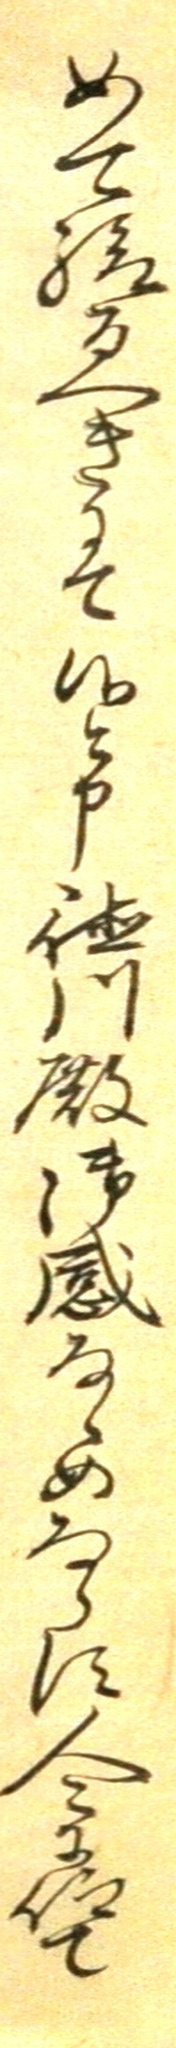めて給るへきにて候と申徳川殿御感なゝめならす人々に仰て
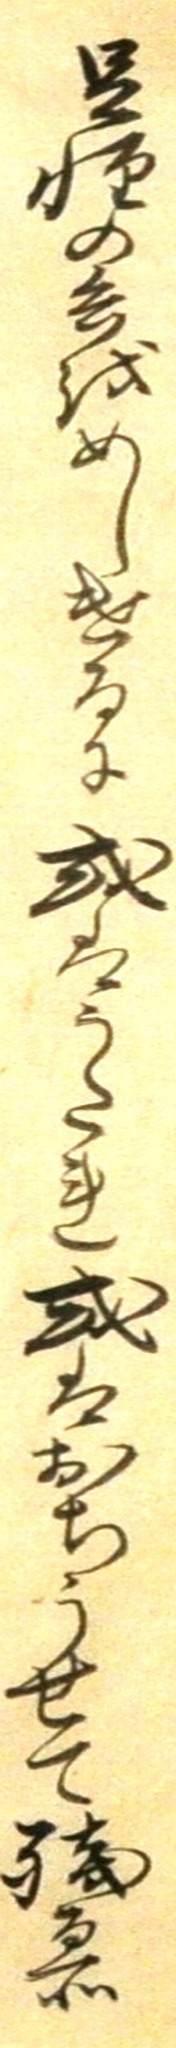足軽の兵をめしけるに或はうたれ或はおちうせて残る所
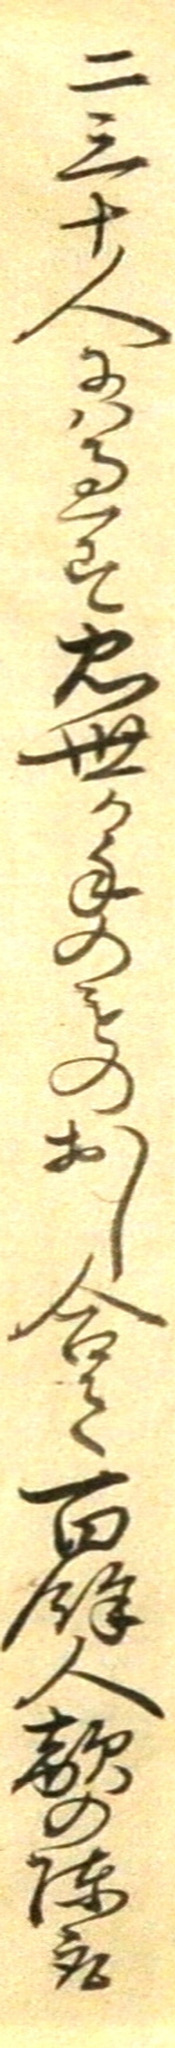二三十人には過す忠世か手のものおし合て百余人敵の陣取
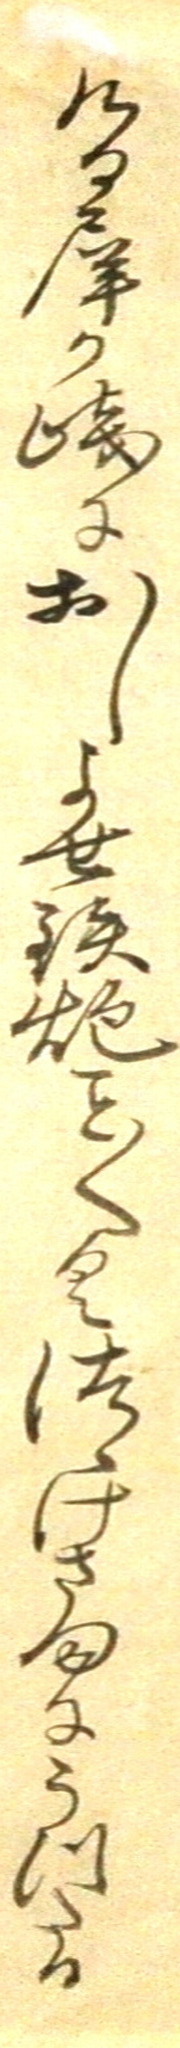ける犀か㟞におしよせ鉄炮こと〳〵くつゝけさまにうつたる
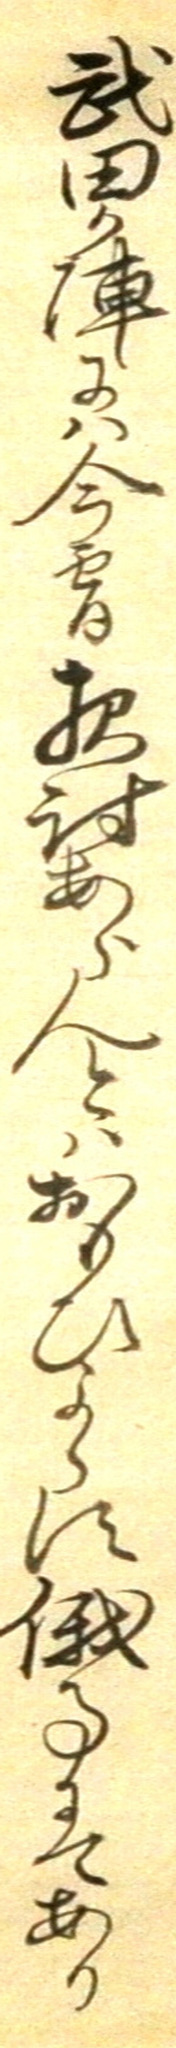武田か陣には今宵夜討あらんとはおもひよらす俄事にてあり
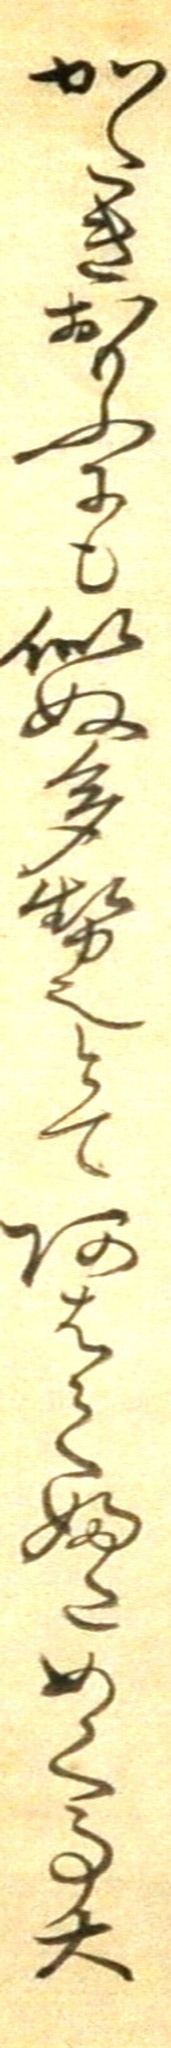かたきおもふにも似ぬ多勢也とてあはてふためく事大
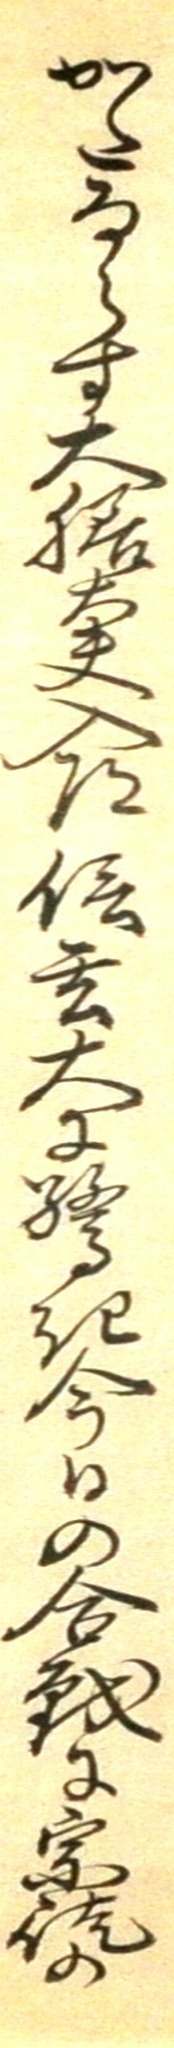かたならす大膳大夫入道信玄大に驚き今日の合戦に宗徒の
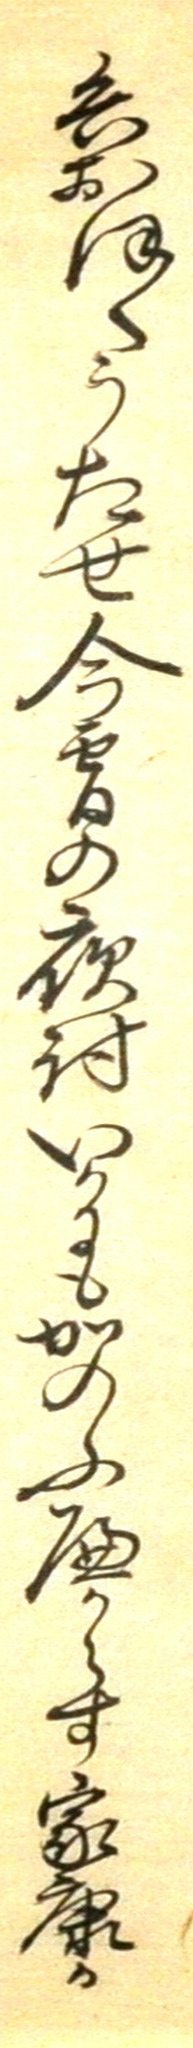兵おほくうたせ今宵の夜討いかにもかのふへからす家康か
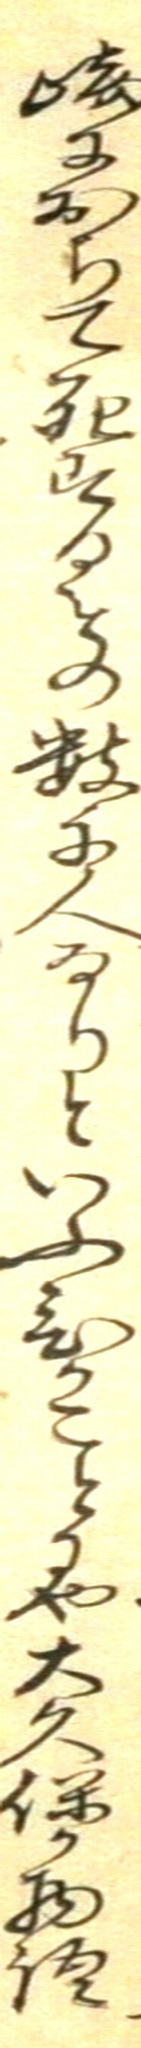㟞におちて死するもの数千人なりといふひかことにや大久保か物語
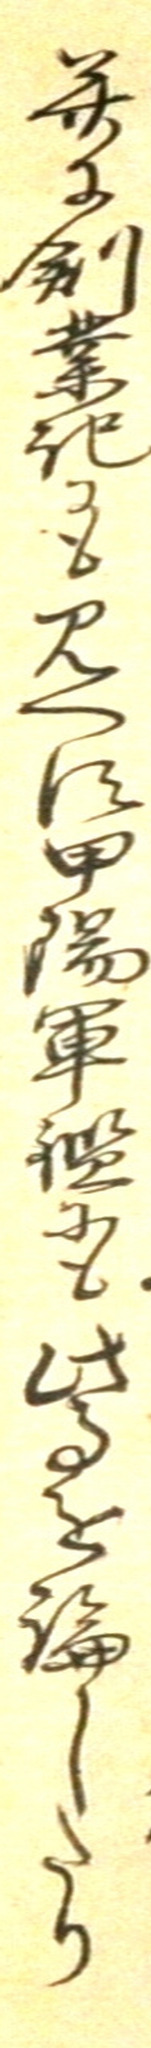幷に創業記にも見へす甲陽軍鑑にも此事を論したり
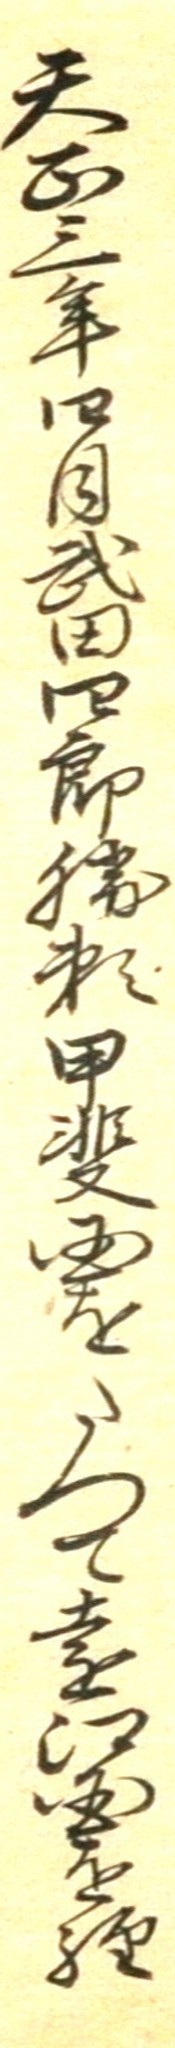天正三年四月武田四郎勝頼甲斐国をたつて遠江国を経
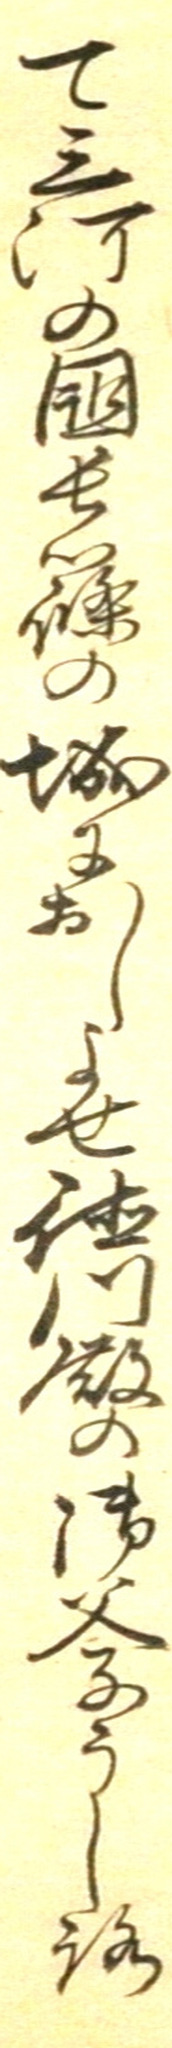て三河の国長篠の城におしよせ徳川殿の御父子うしろ
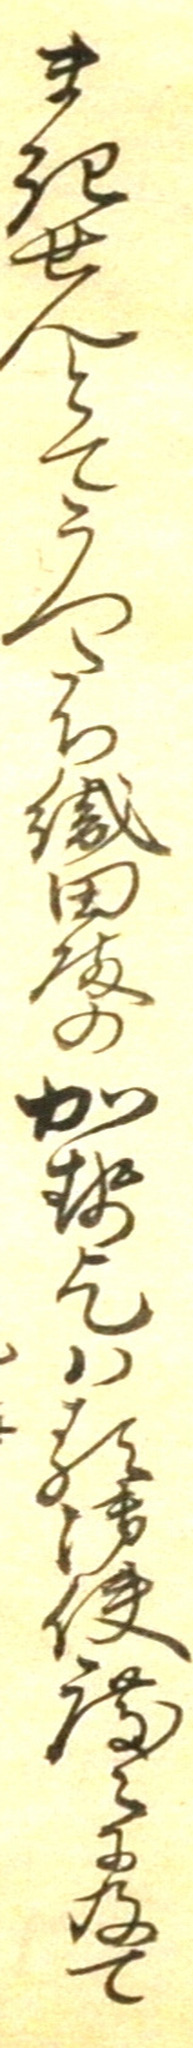まきせんとてうつたち織田殿の加勢乞はる御使度々に及て
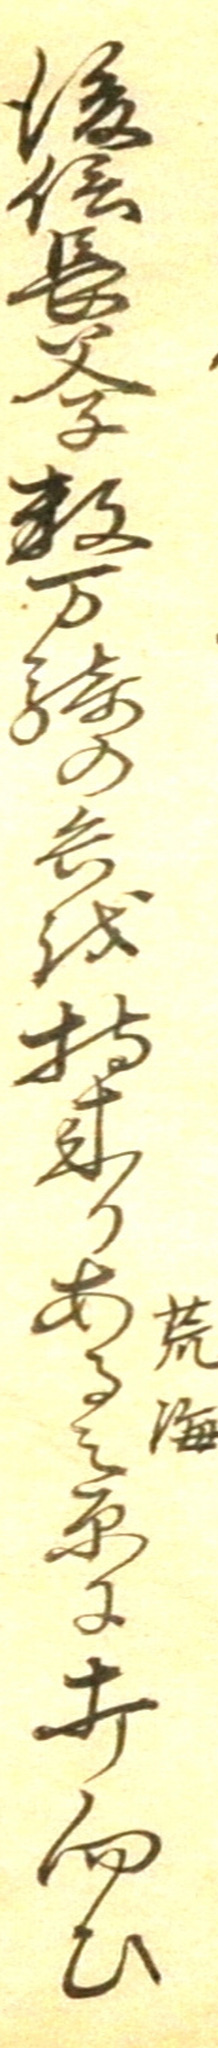後信長父子数万騎の兵を持来りあるみ原に打向ひ
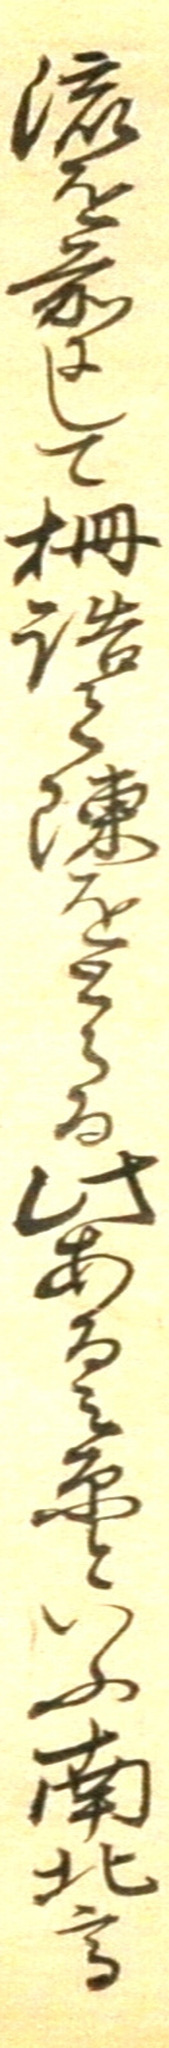流を前にして柵詰て陳をとらる此あるみ原といふ南北高
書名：藩翰譜（四・中）
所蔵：伊那市立高遠町図書館・合同会社AMANE
